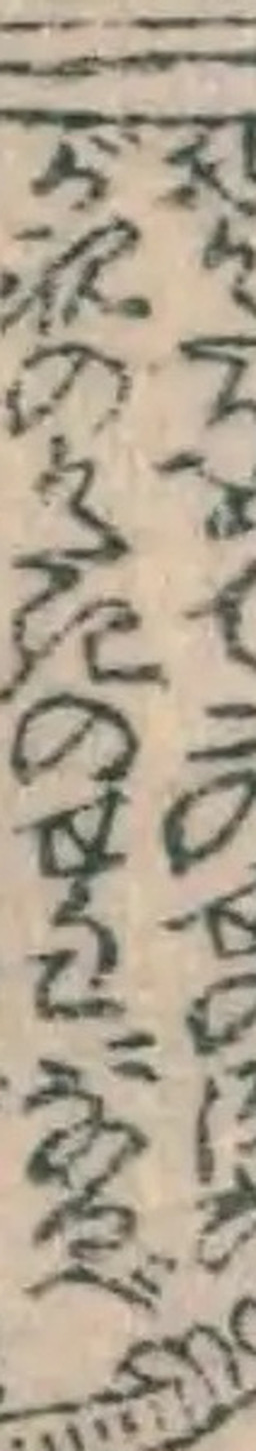が親のかたきのせうこになるべ
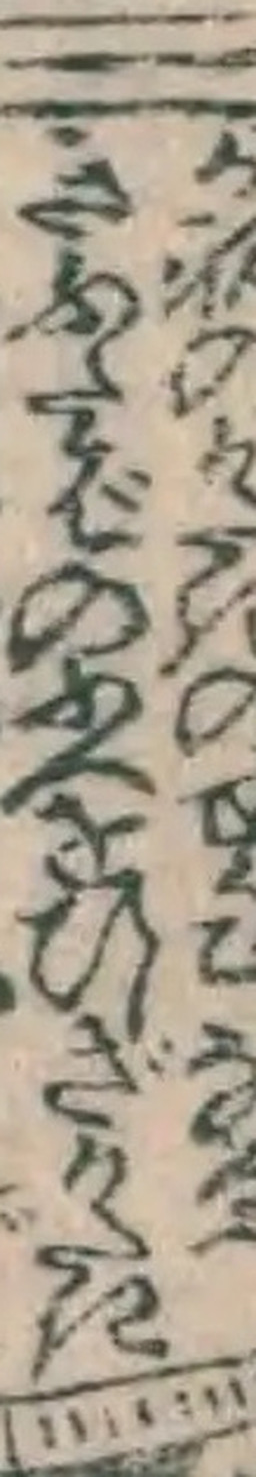きふたばのふへをひしぎかたき
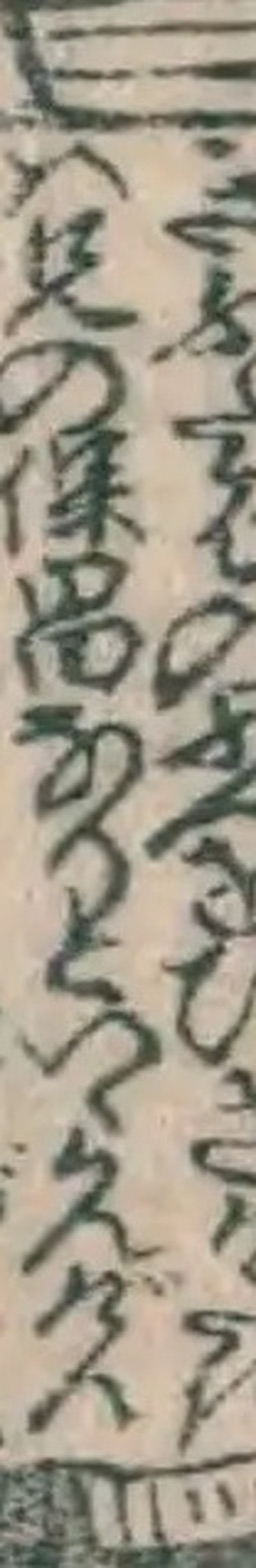は兄の保昌なりといゝかんげん
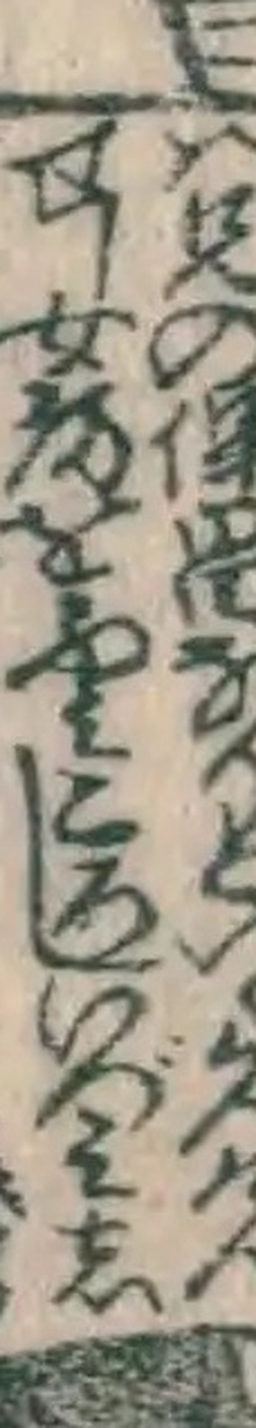せし女房をふみころしいづみし
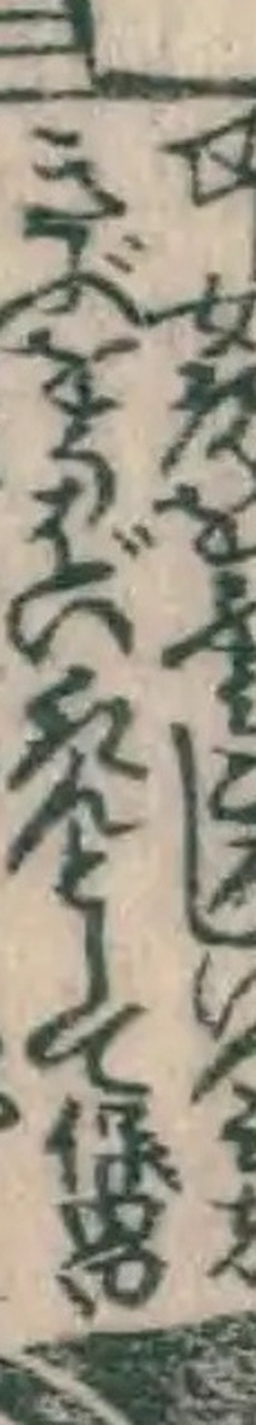きぶをうばい取んとして保昌
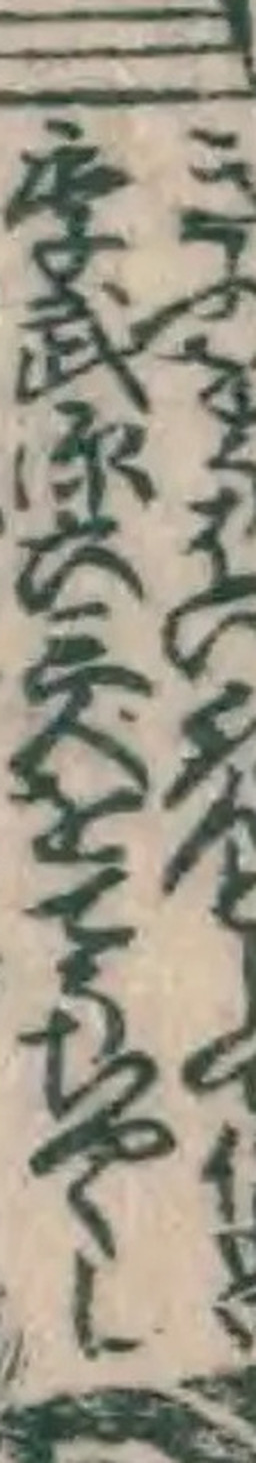季武源六三人をてうちやくし
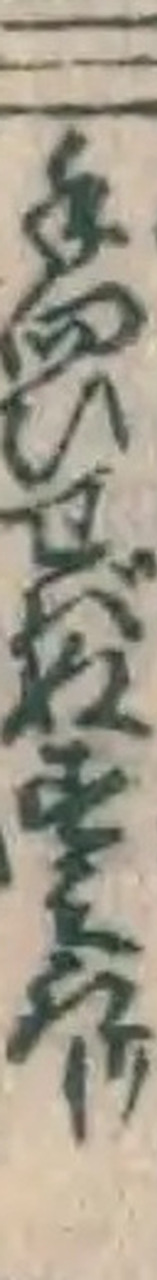手向ひせばぬすみ取りし
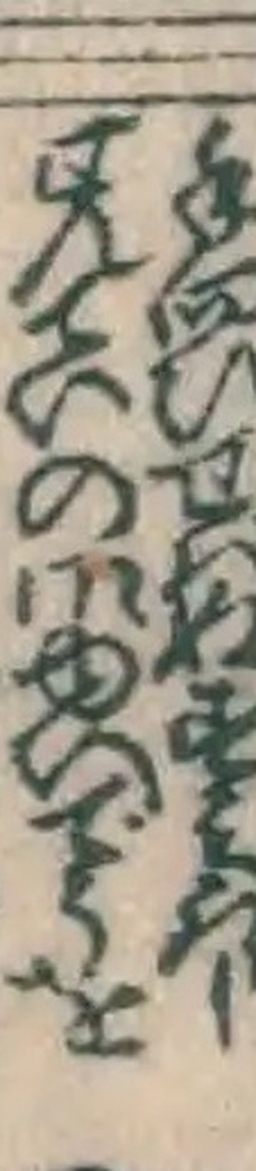せんていの御ゆいでうを
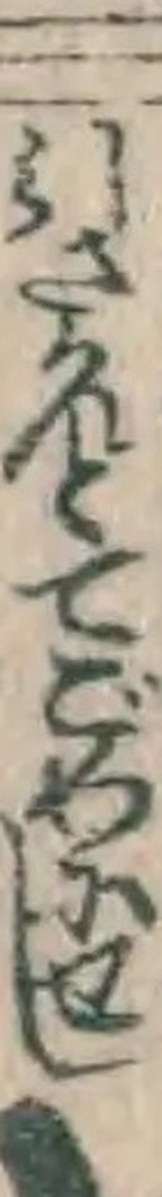引さかんとてごめにせし
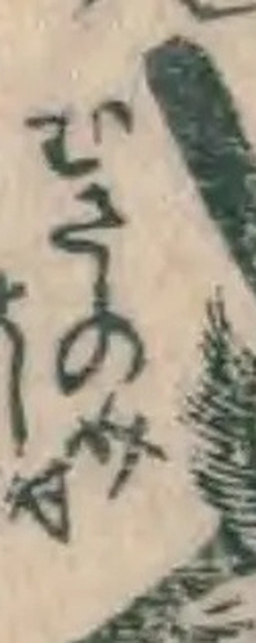むさしの介
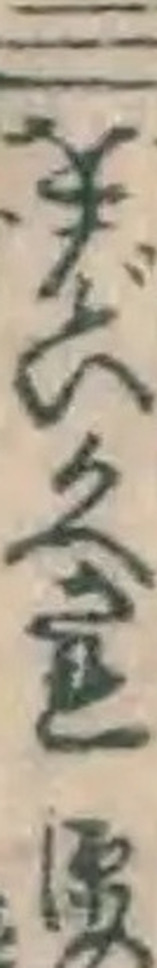をばいかへされ
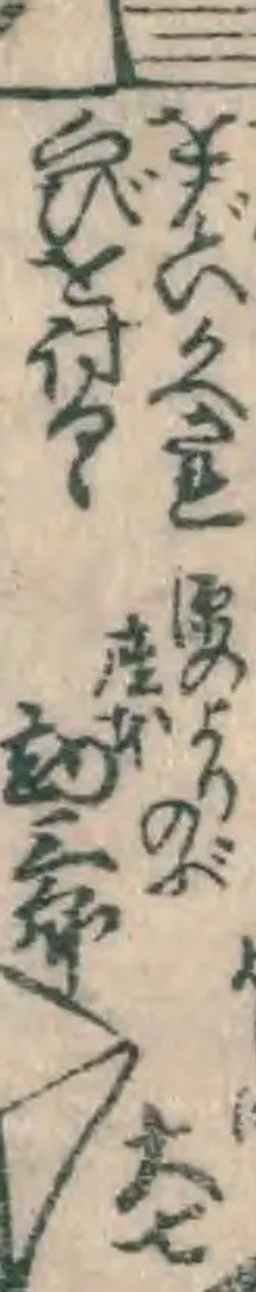くびを付るゝ
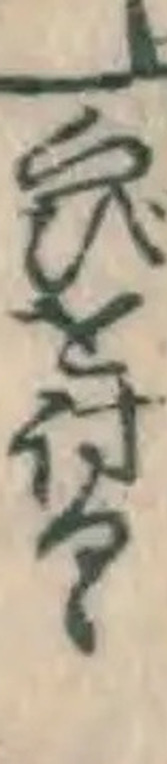くびを付るゝ
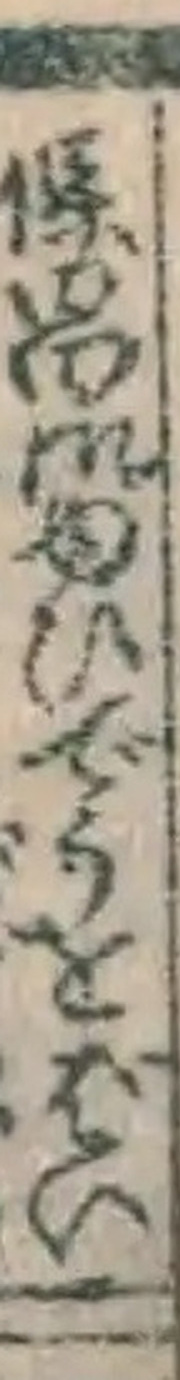保昌御ゆいでうをばい
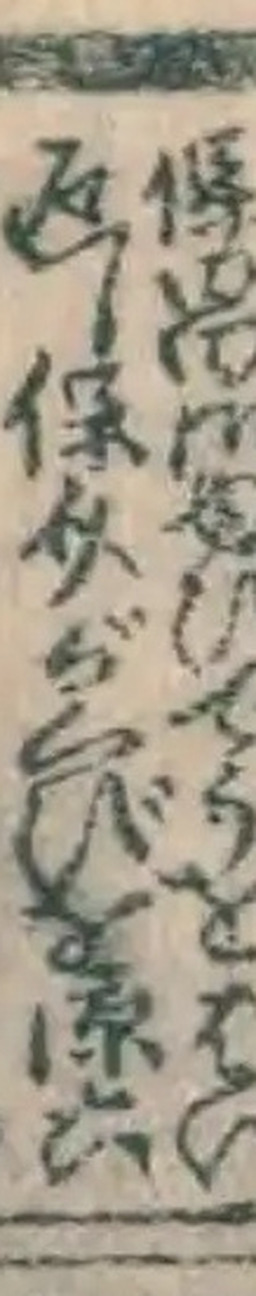返し保介がくびを源六
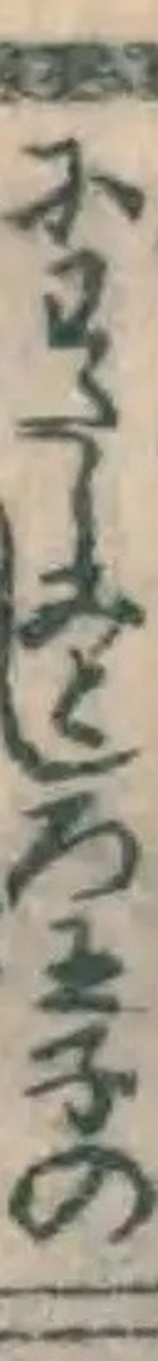にわたしみとしろ王子の
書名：四天王宿直着綿
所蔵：国立国会図書館 National Diet Library, JAPAN
